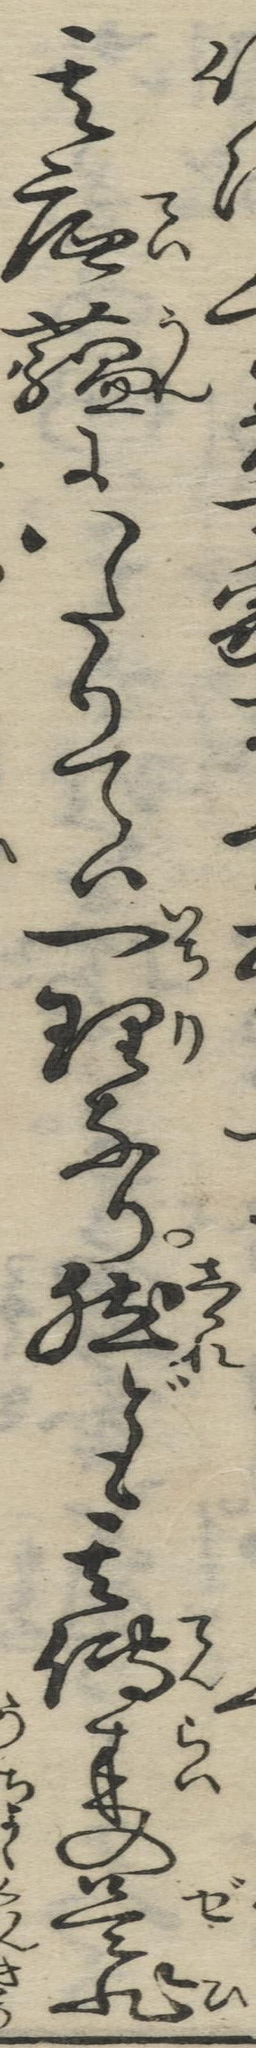其底蘊にいたりては一理なり。然ども其伝来の是非
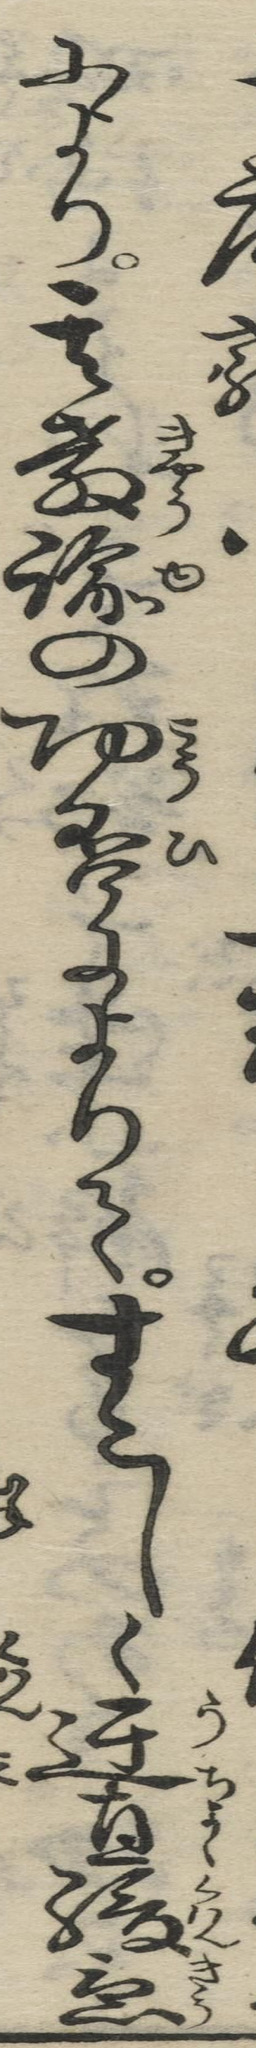により。其教諭の功否によりて。すこしく迂直緩急
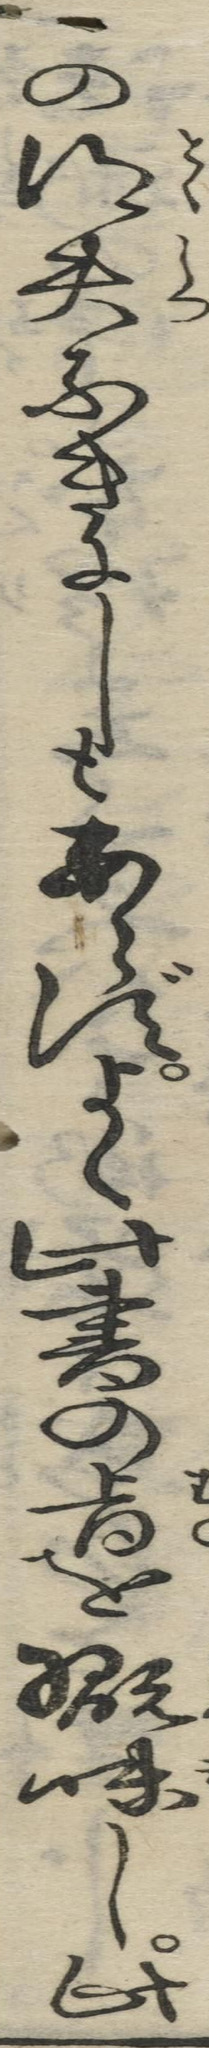の得失なきにしもあらず。よく此書の旨を翫味し。此
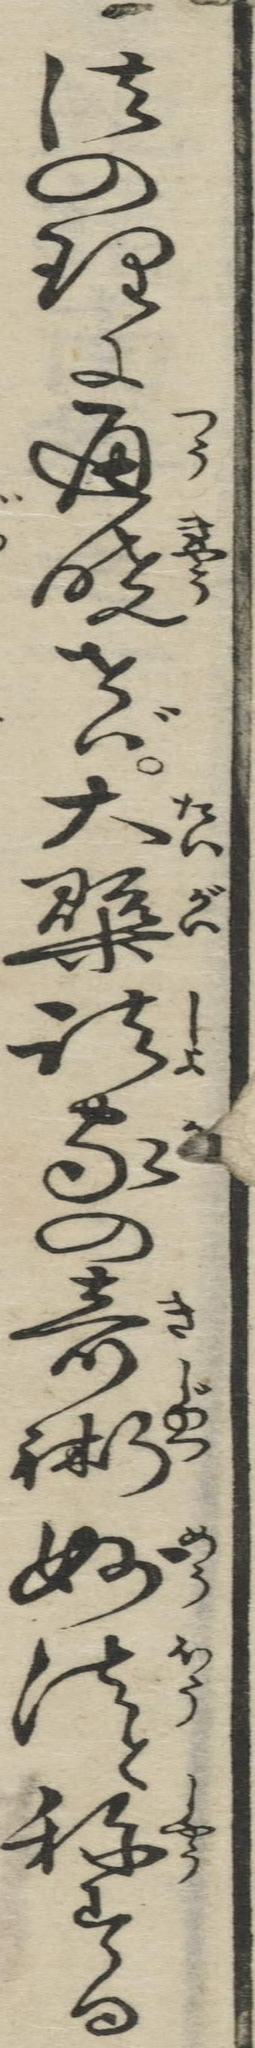法の理に通暁せば。大概諸家の奇術妙法と称する
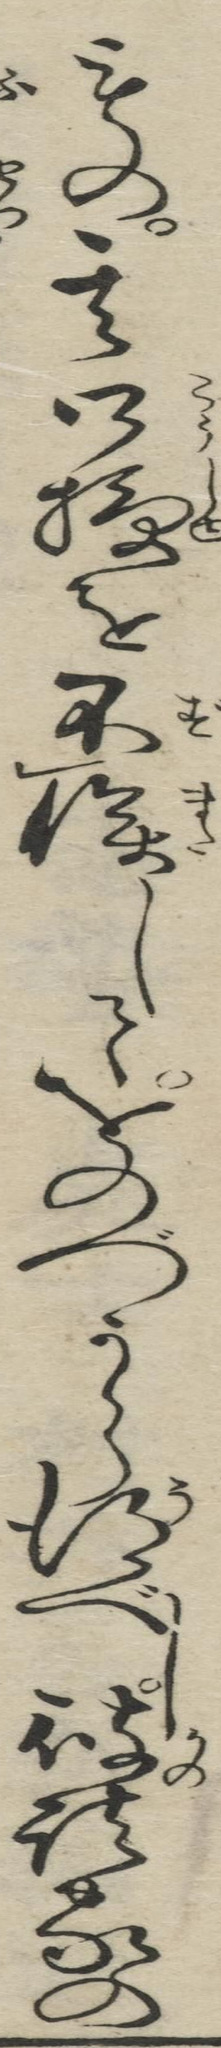もの。其口授を不俟して。をのづから得べし。彼諸家の
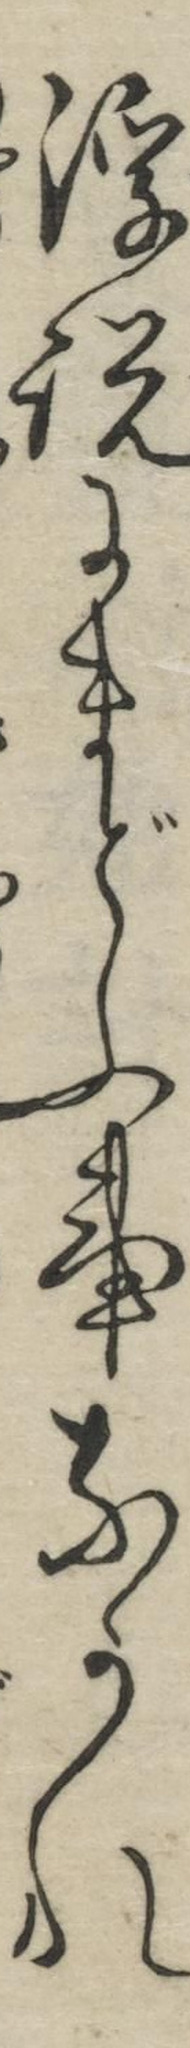浮説にまどふ事なかれ
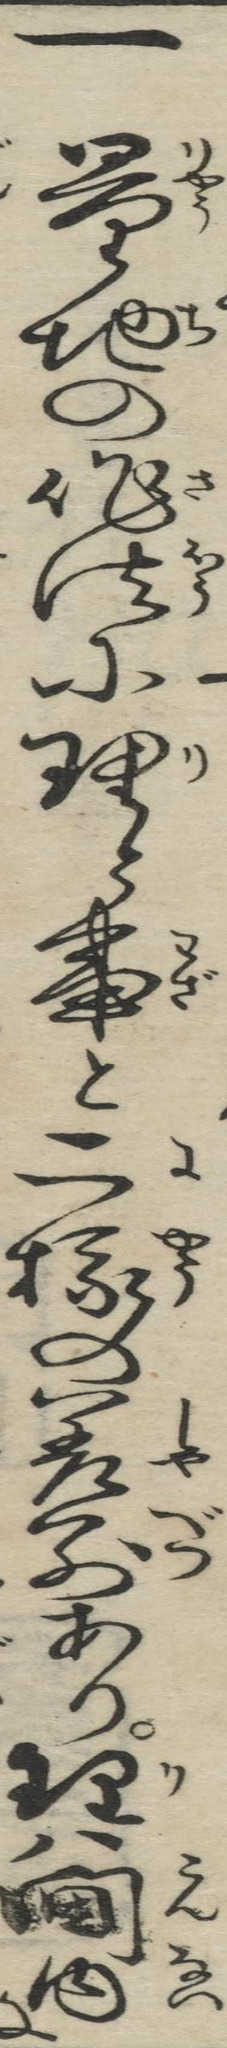一量地の作法に理と事と二様の差別あり。理は閾内に
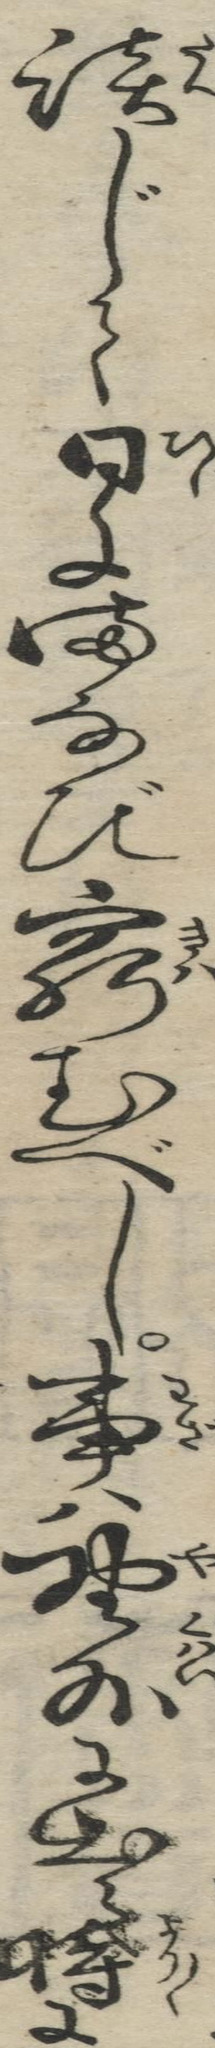談じて日にまなび窮むべし。事は野外に出て時に
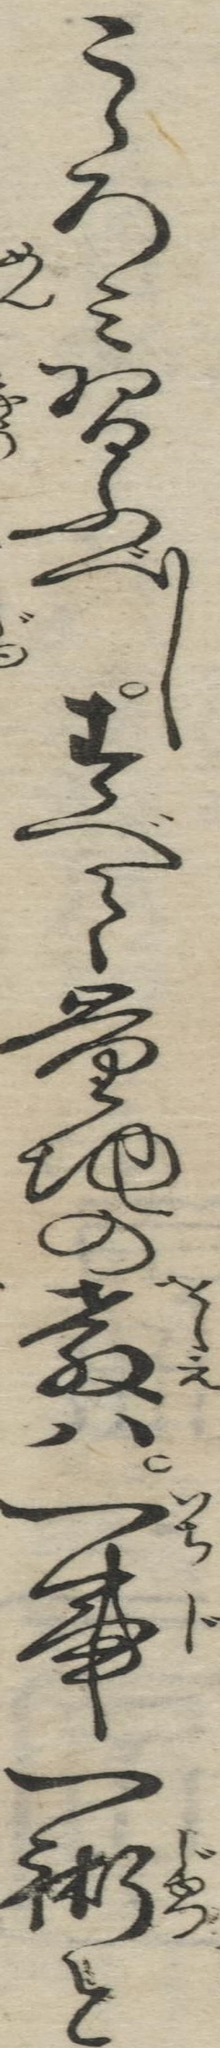こゝろみ習ふべし。すべて量地の教は。一事一術と
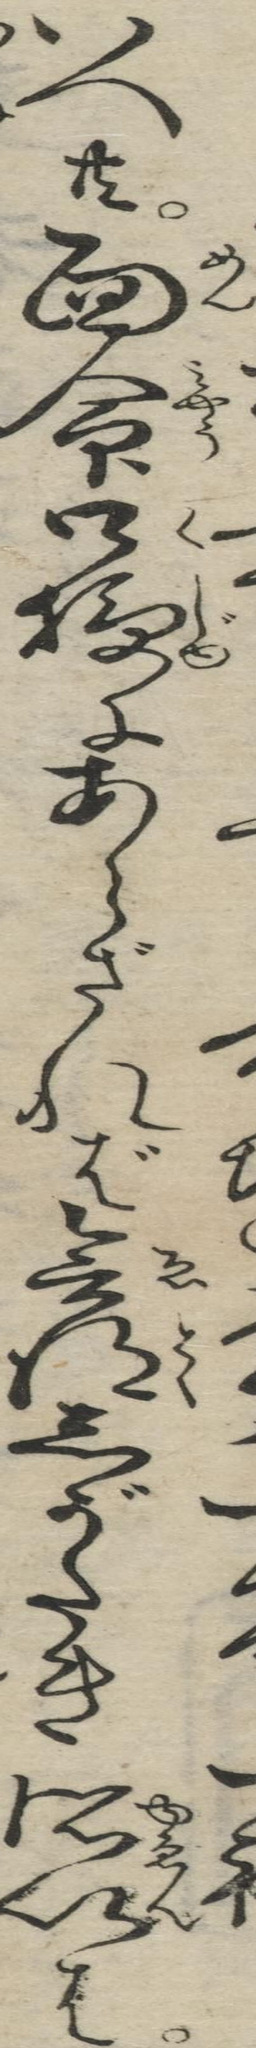いへども。面命口授にあらざれば会得しがたき所以は
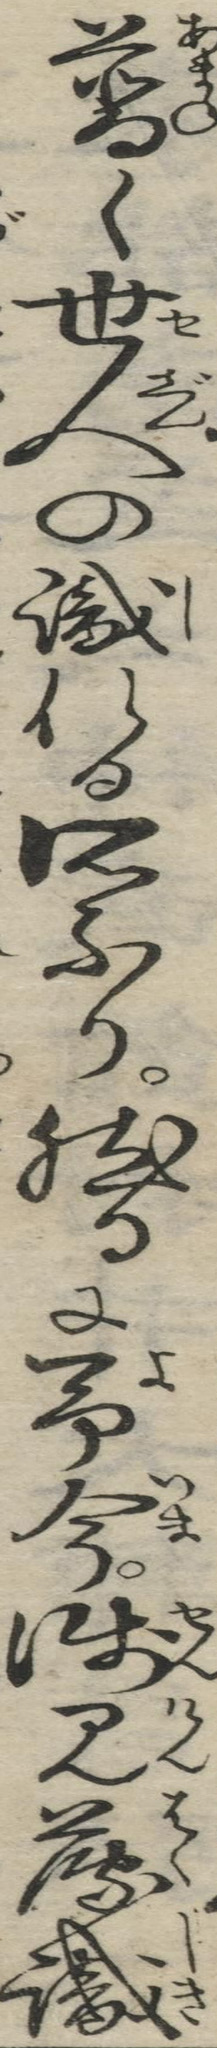普く世人の識れる所なり。然るに予今。浅見薄識
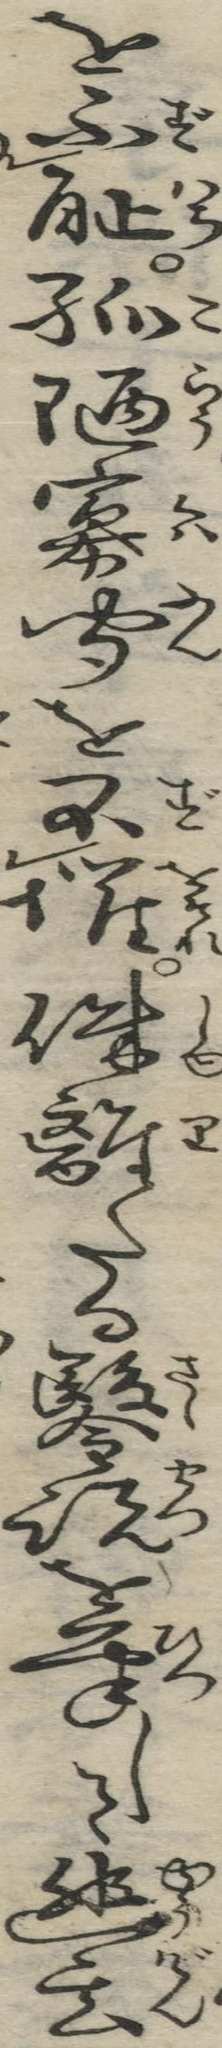を不恥。孤陋寡聞を不懼。侏離たる鑿説を筆して幽玄
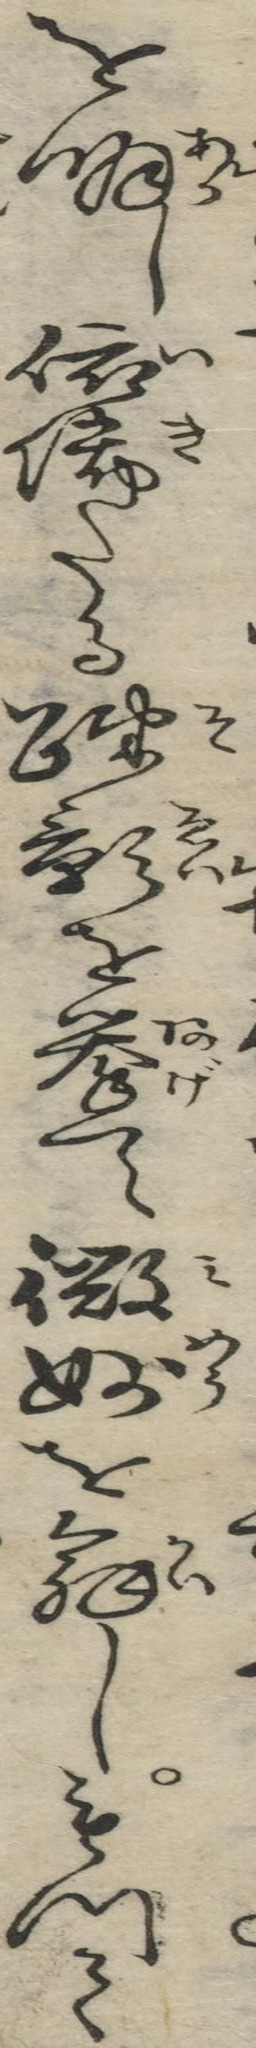を明し依稀たる踈影を挙て微妙を解し。もつて
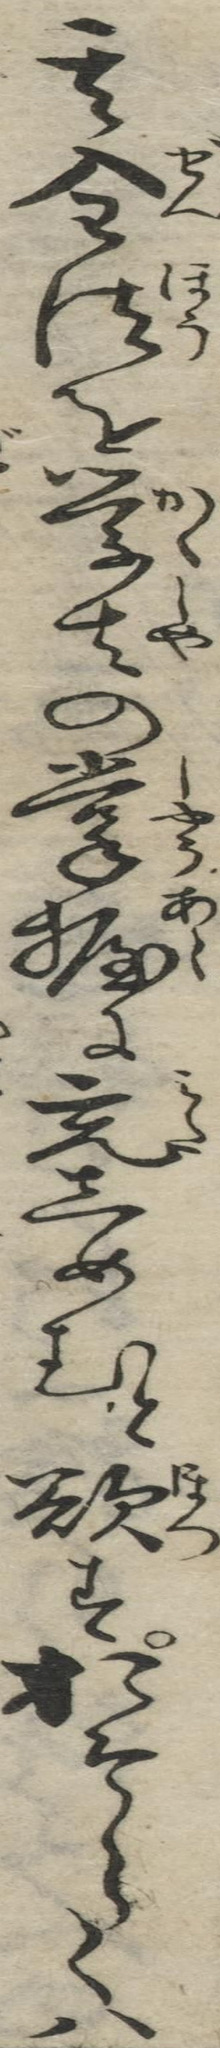其全法を学者の掌握に充しめむと欲す。おそらくは
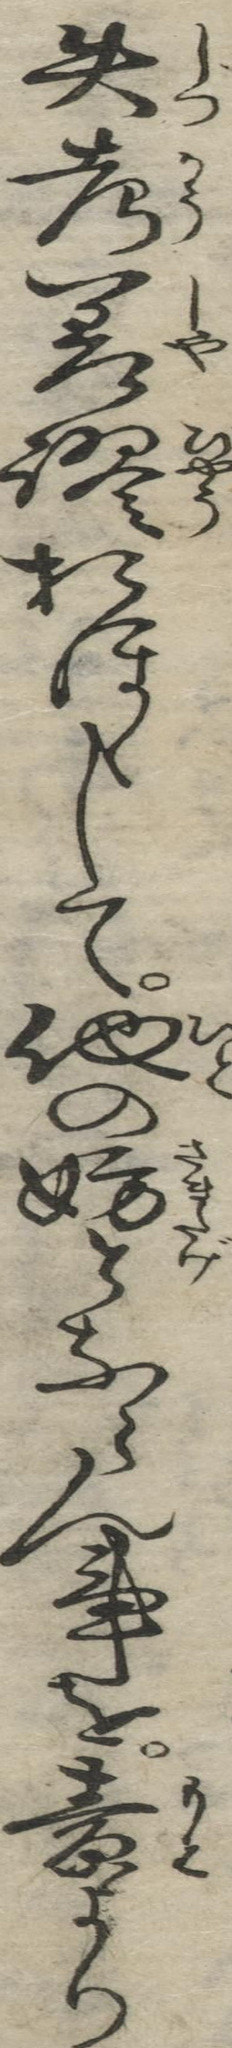失考差謬おほくして。他の妨とならん事を。素より

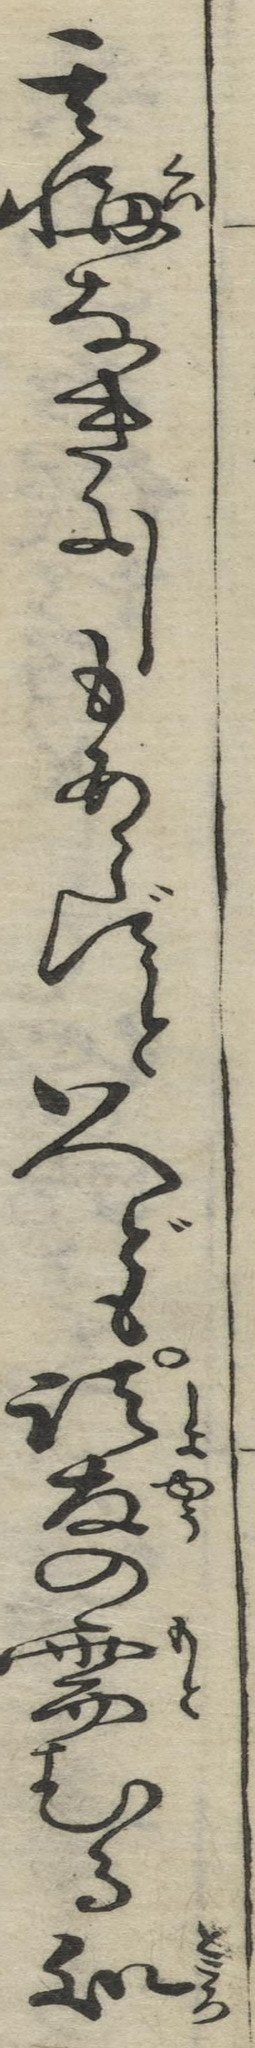其悔なきにしもあらずといへども。諸友の需むる処
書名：量地指南　巻之一（内題）
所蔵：東京大学地震研究所図書室 Earthquake Research Institute Library, The University of Tokyo, JAPAN
